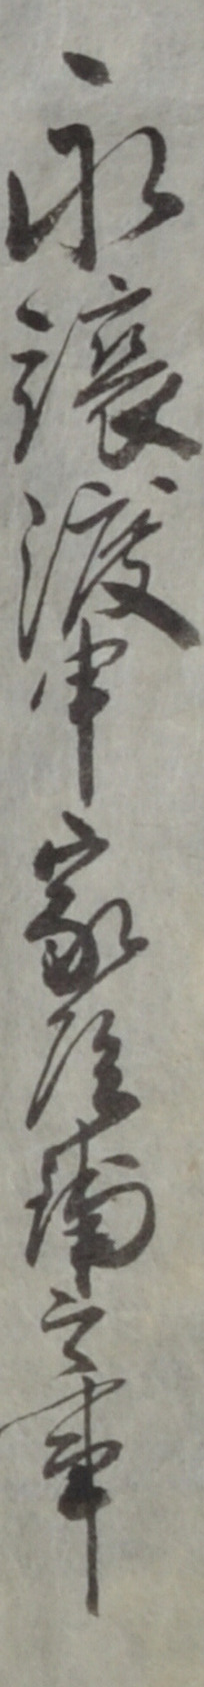永譲渡申家屋鋪之事
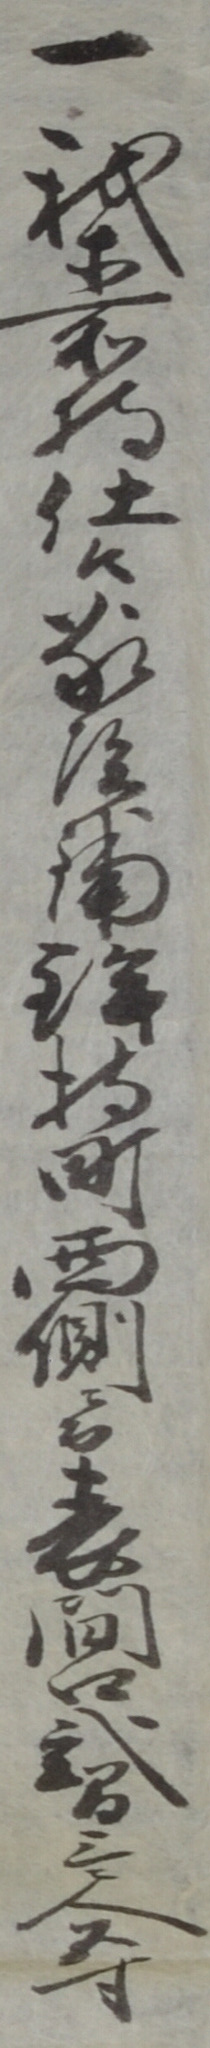一我等所持仕候家屋鋪鉾持町西側ニ而表間口弐間三尺五寸
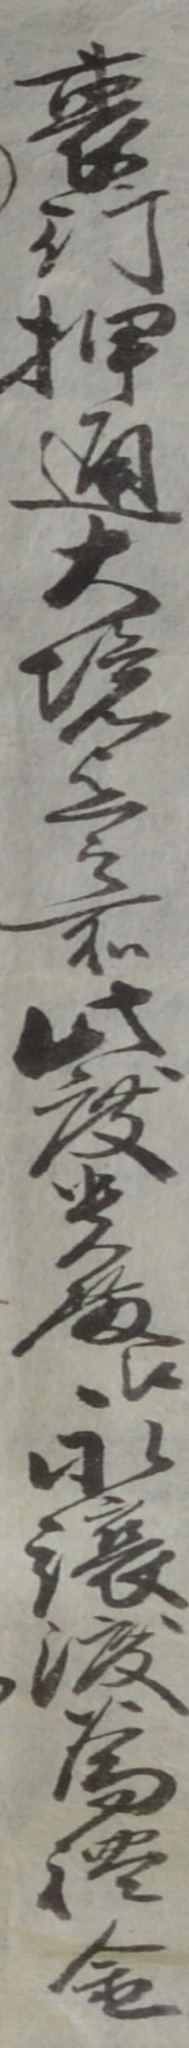裏行押通大境迄之所此度貴殿江永譲渡為礼金
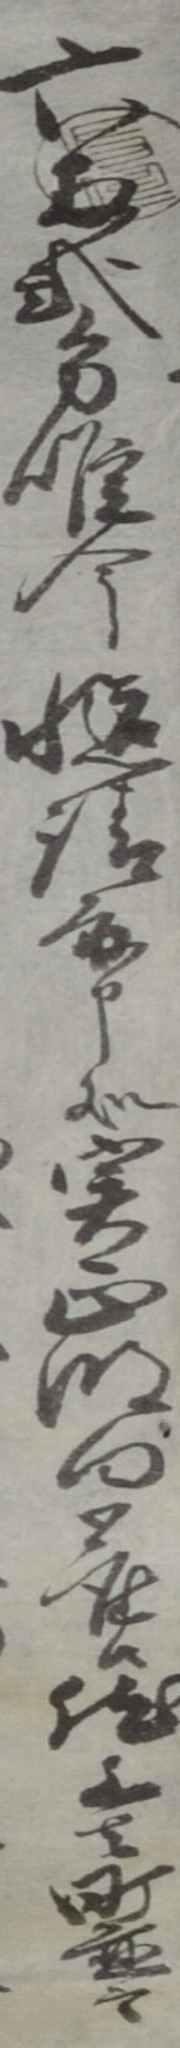六両弐分唯今慥請取申処実正明白御座候然上者町並之
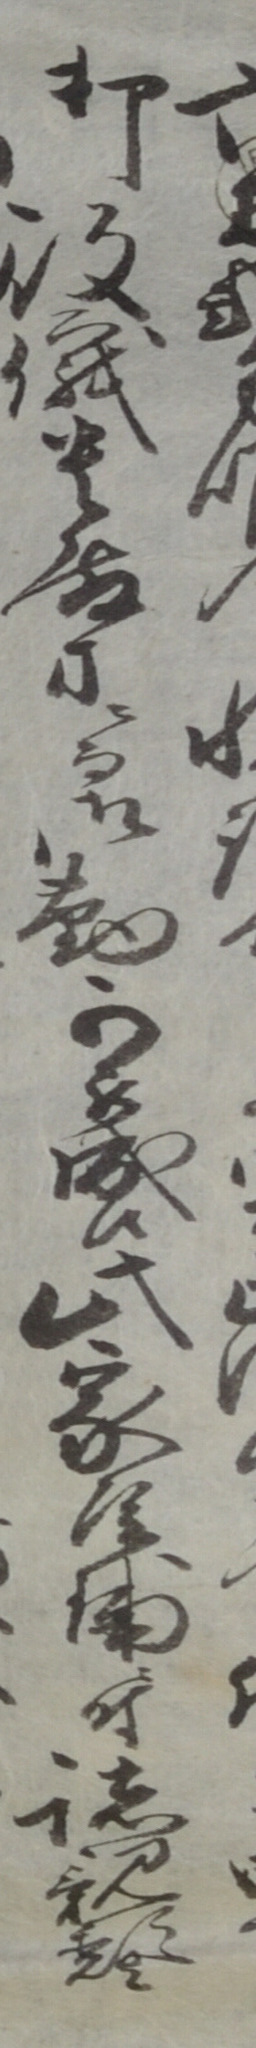御役儀貴殿方ニ而御勤可相成候此家屋鋪ニ付諸親類者
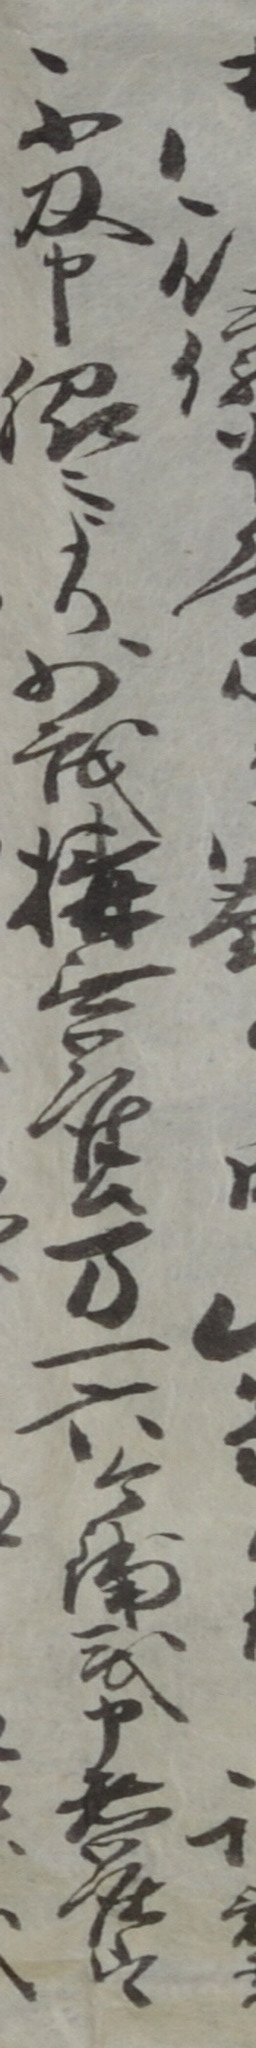不及申脇々より少茂構無御座候万一六ケ鋪義申者御座候
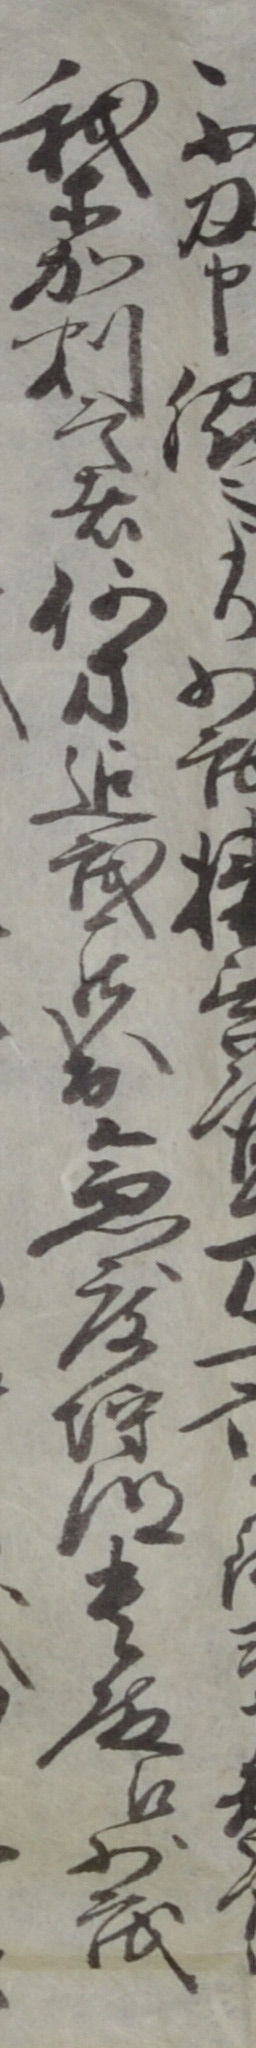我等加判之者何方迠茂罷出急度埒明貴殿江少茂
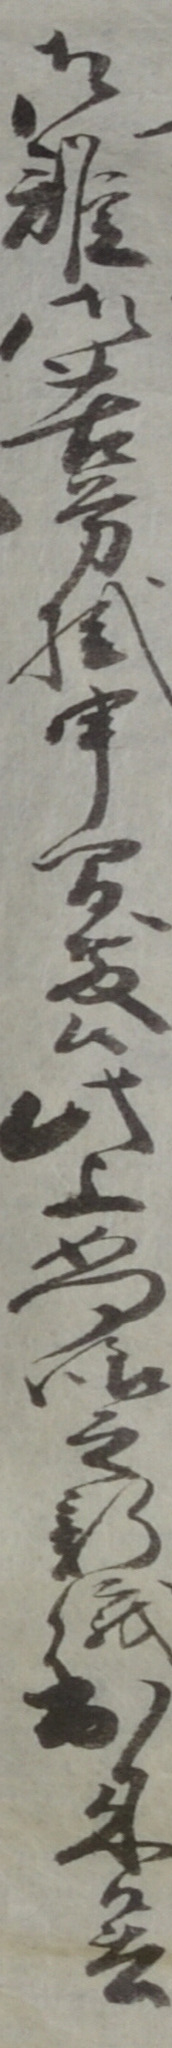御難御苦労掛申間敷候此上如何様之新儀出来候共
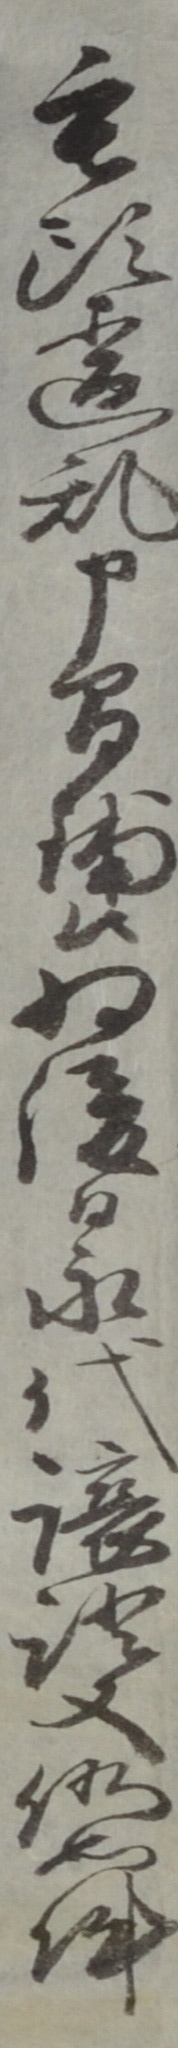毛頭違乱申間鋪候為後日永代譲証文仍如件
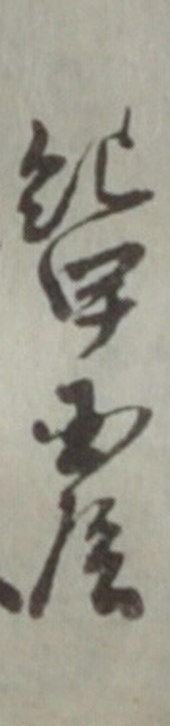紀伊国屋
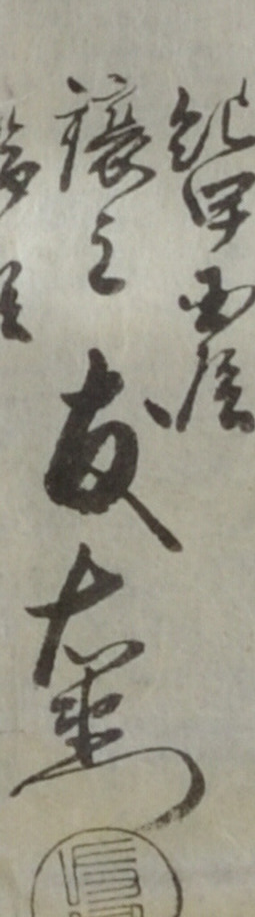譲主友右衛門㊞
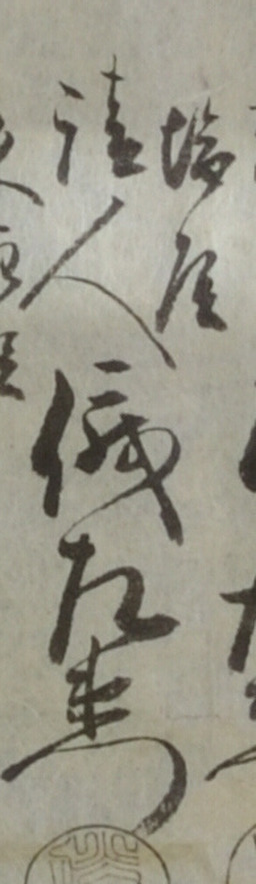請人儀左衛門㊞
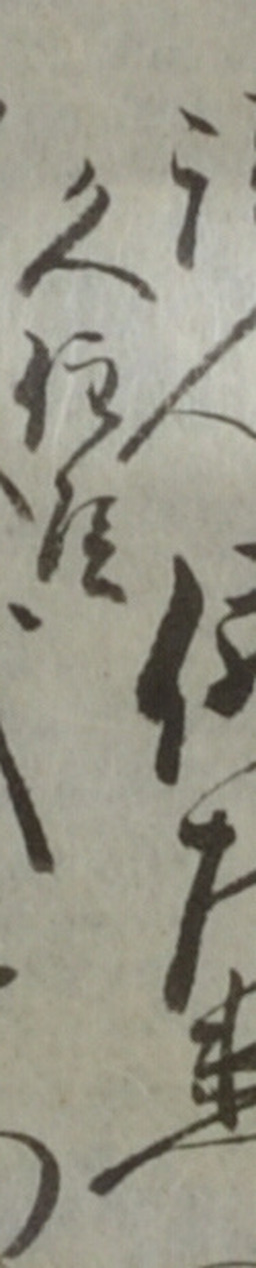久住屋
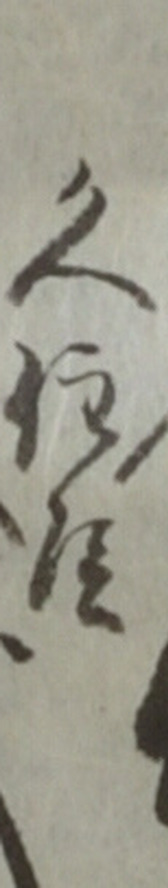久住屋
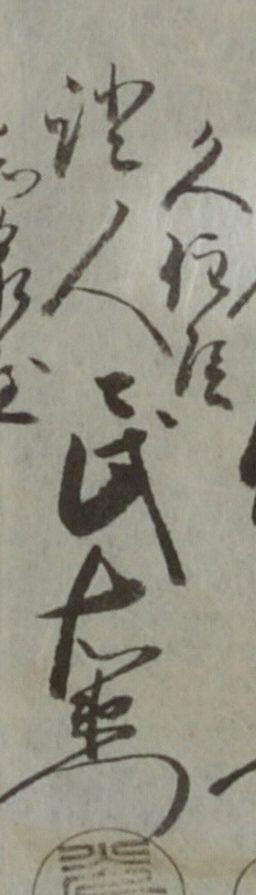証人民右衛門㊞
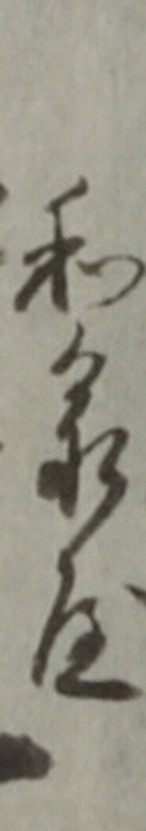和泉屋
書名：永譲渡申家屋敷之事
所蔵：伊那市立高遠町図書館・合同会社AMANE
